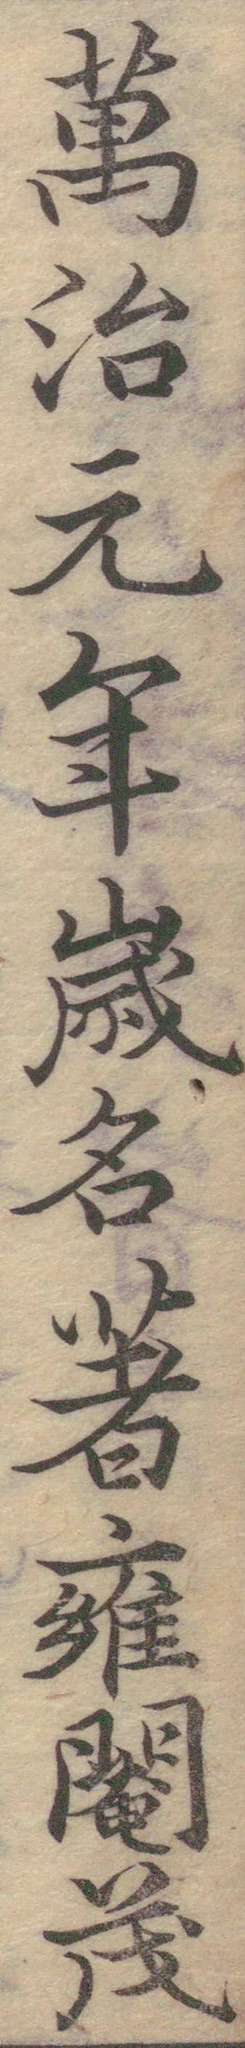萬治元年歳名著雍鬮茂
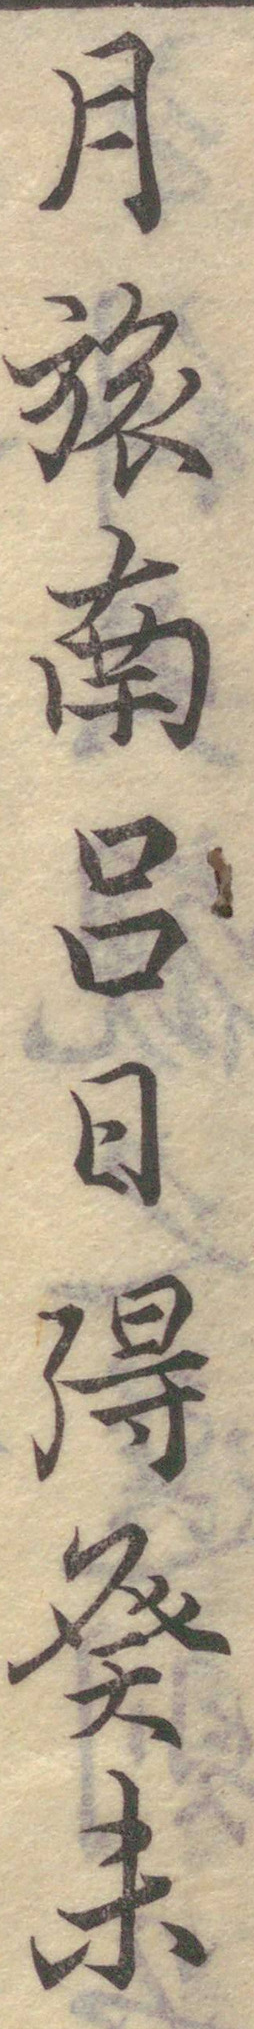月旅南呂日得癸未
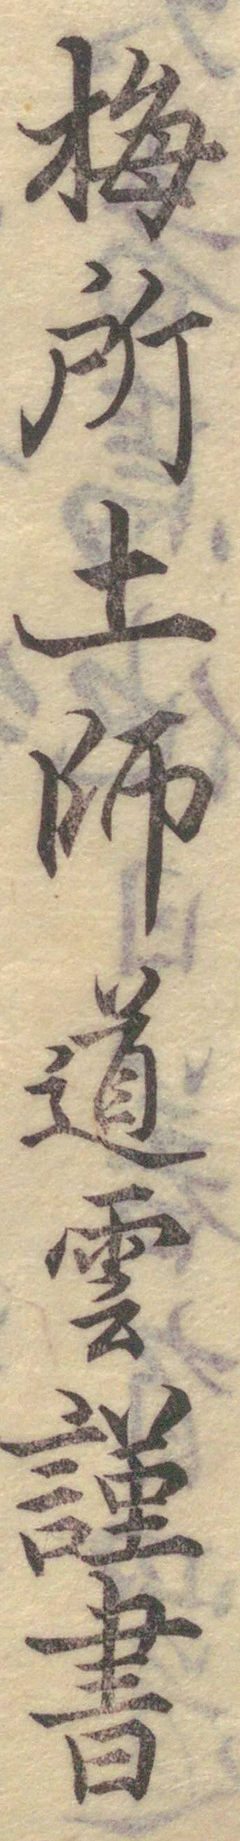梅所土師道雲謹書
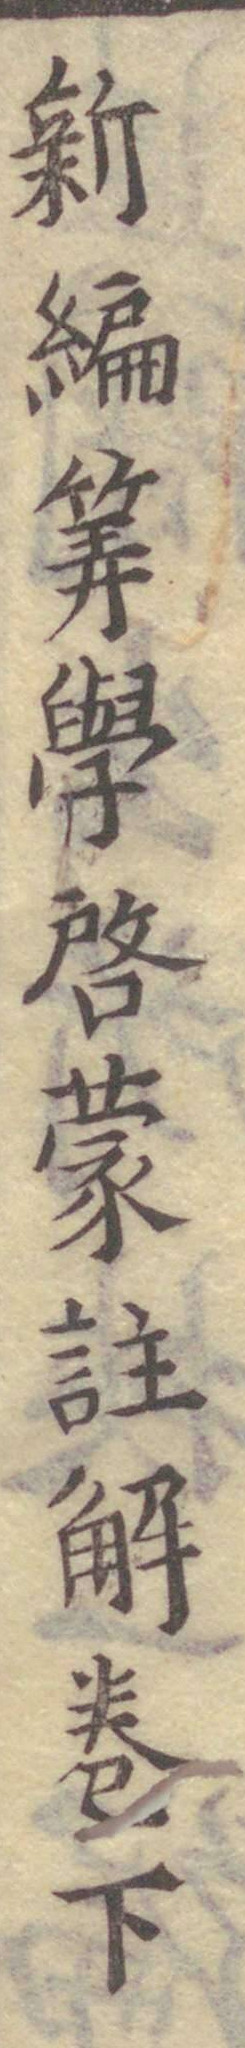新編筭学啓蒙註解巻下
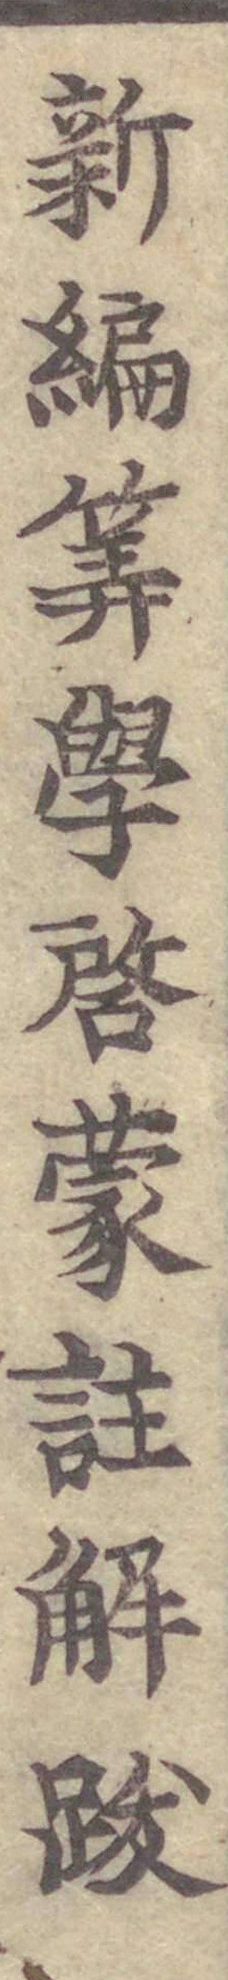新編筭学啓蒙註解跋
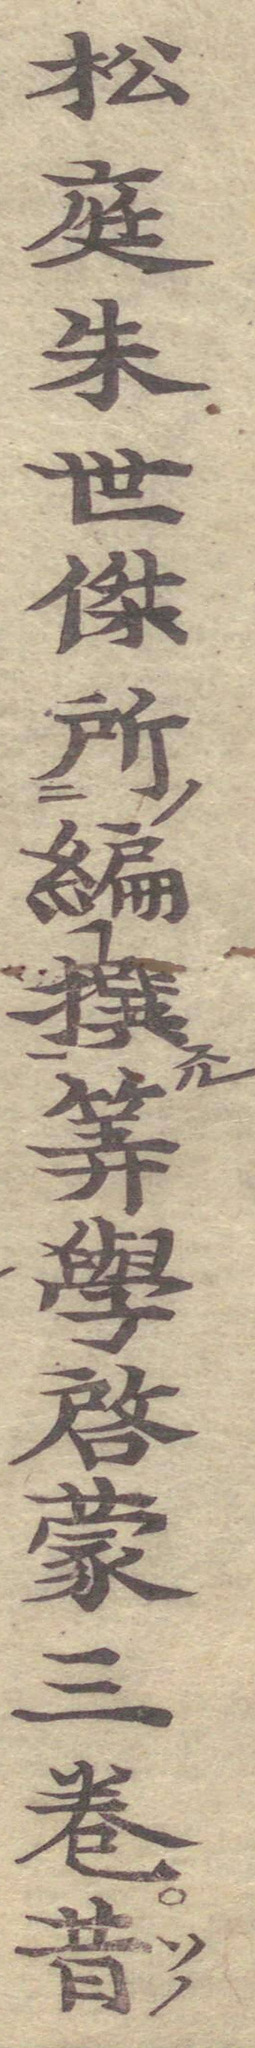松庭朱世傑所編-撰筭学啓蒙三巻。昔

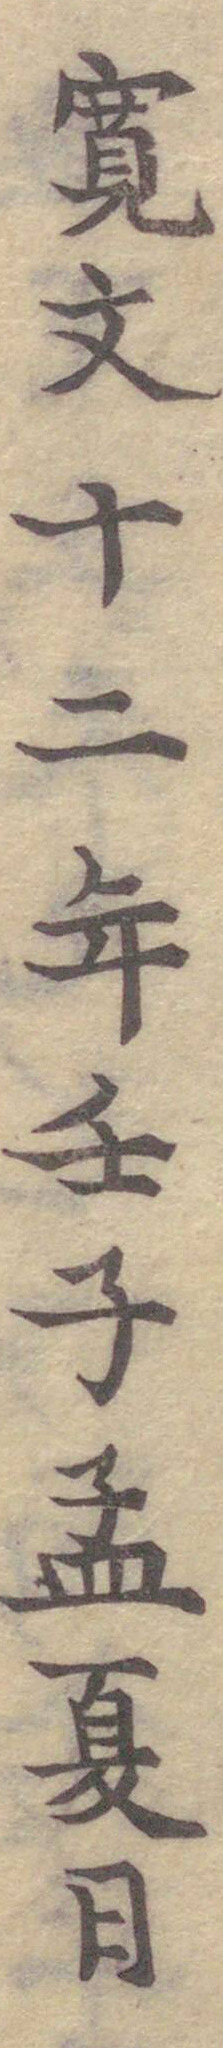寛文十二年壬子孟夏日
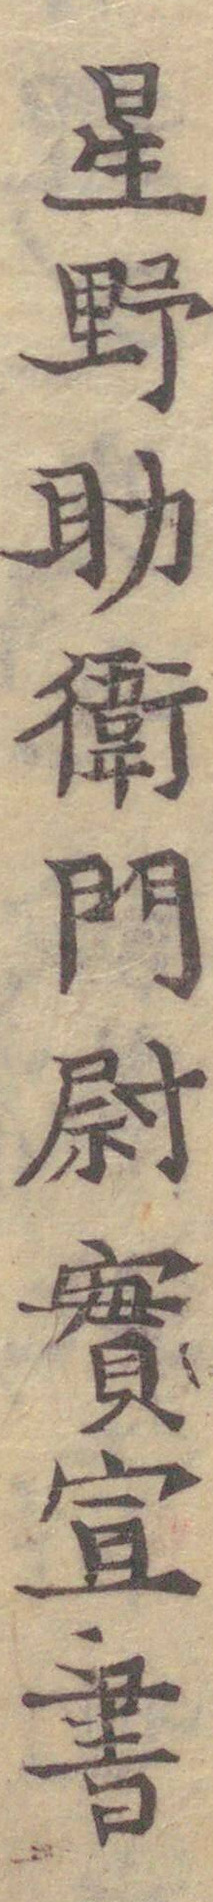星野助衛門尉實宣書
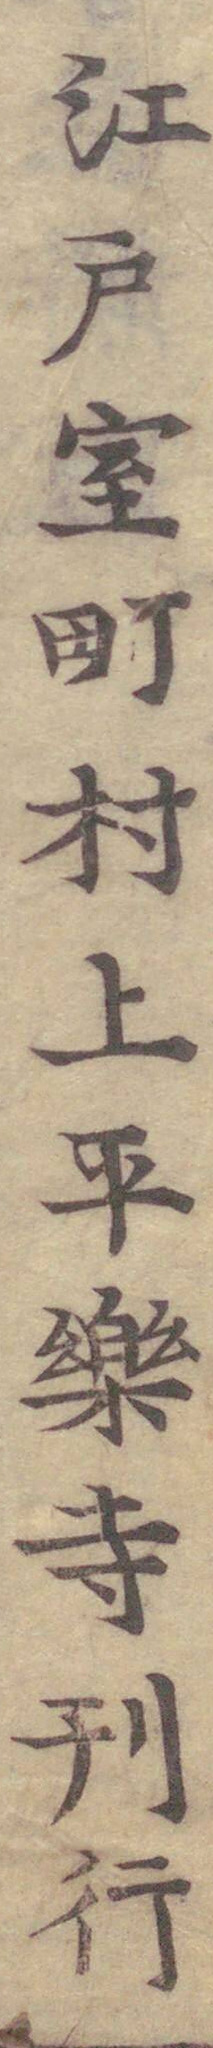江戸室町村上平楽寺刊行
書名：新編筭学啓蒙註解 寛文十二〈江戸〉村上平楽寺 桑木文庫和書298
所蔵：九州大学中央図書館 国文学研究資料館
